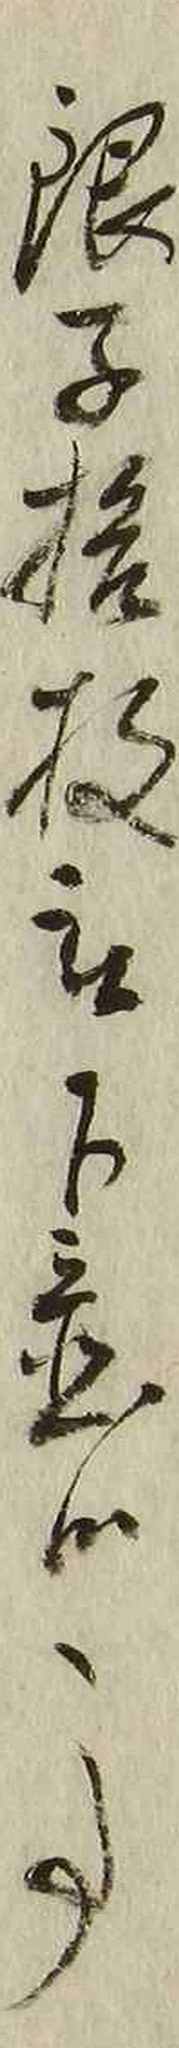銀子拾枚被下置候事
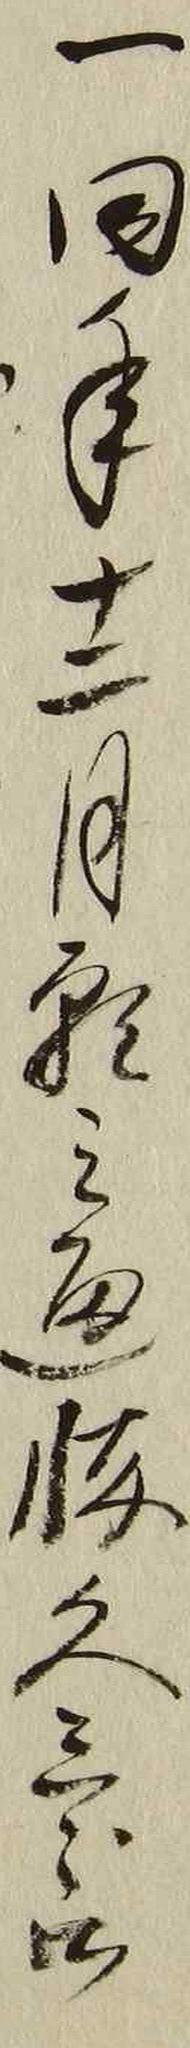一同年十二月願之通忰久三郎御
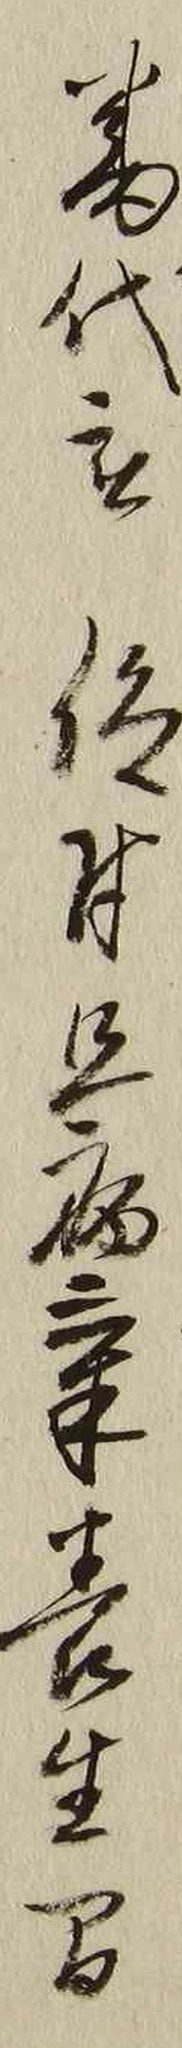番代被仰付旦病気養生間
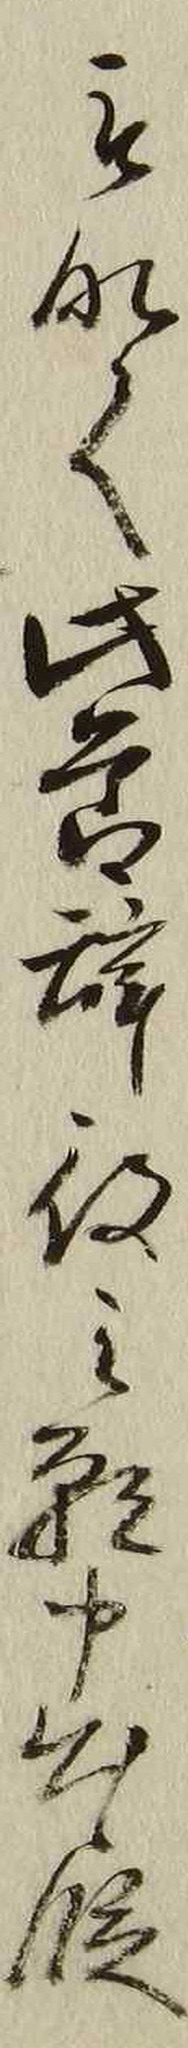もなく此節辞役之願申出候段
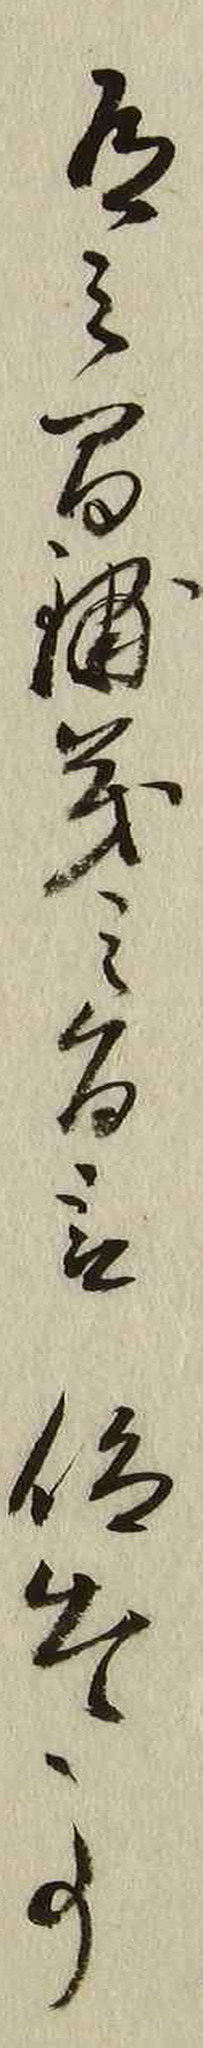有之間鋪義之旨被仰出候事
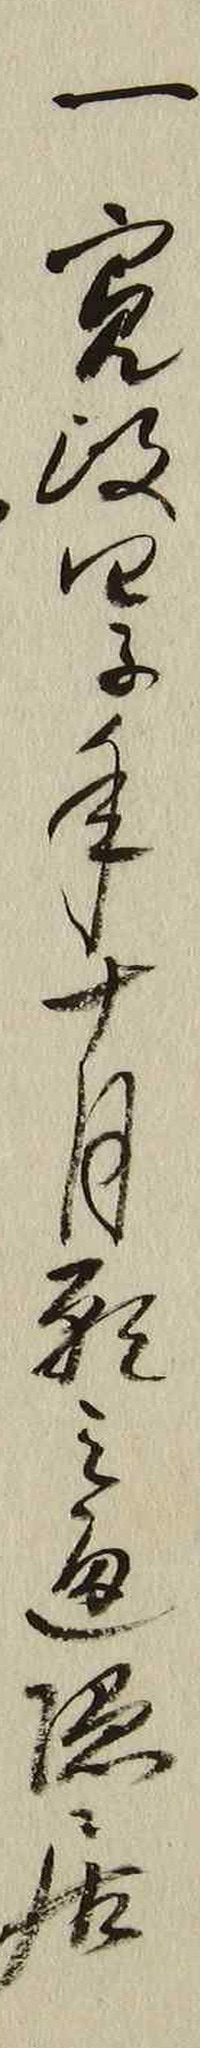一寛政四子年十月願之通隠居
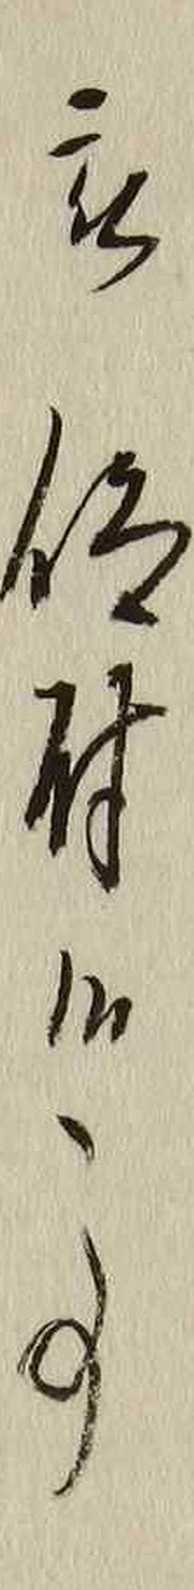被仰付候事
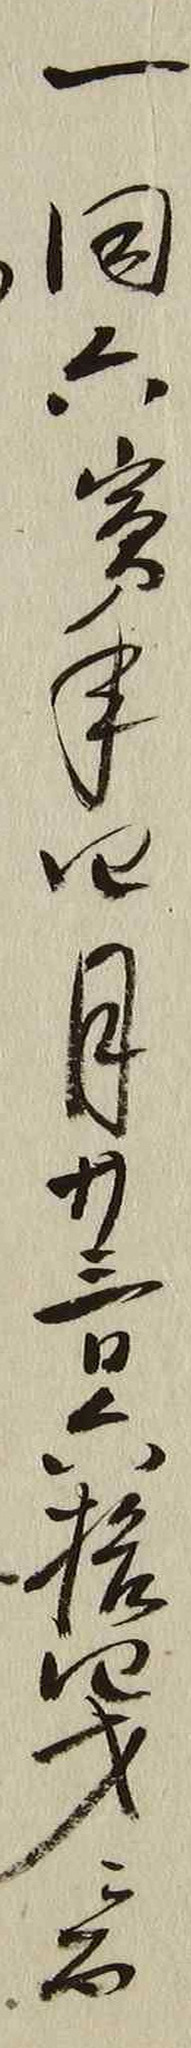一同六寅年四月廿三日六拾四才ニ而
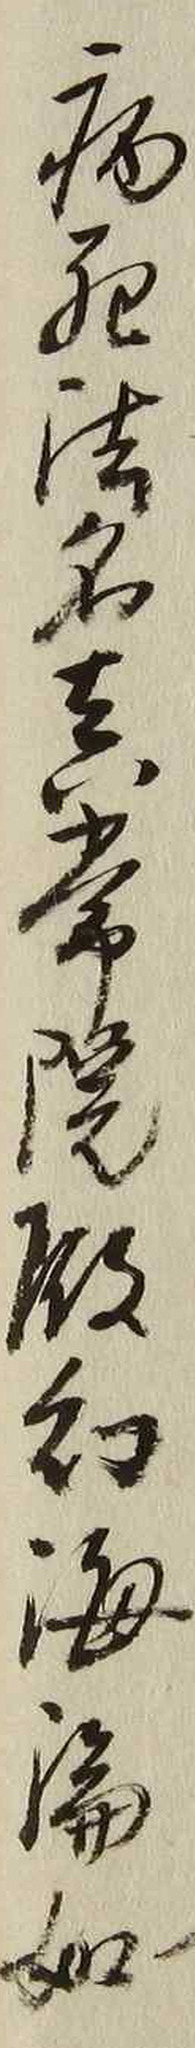病死法名真常院殿幻海淪如
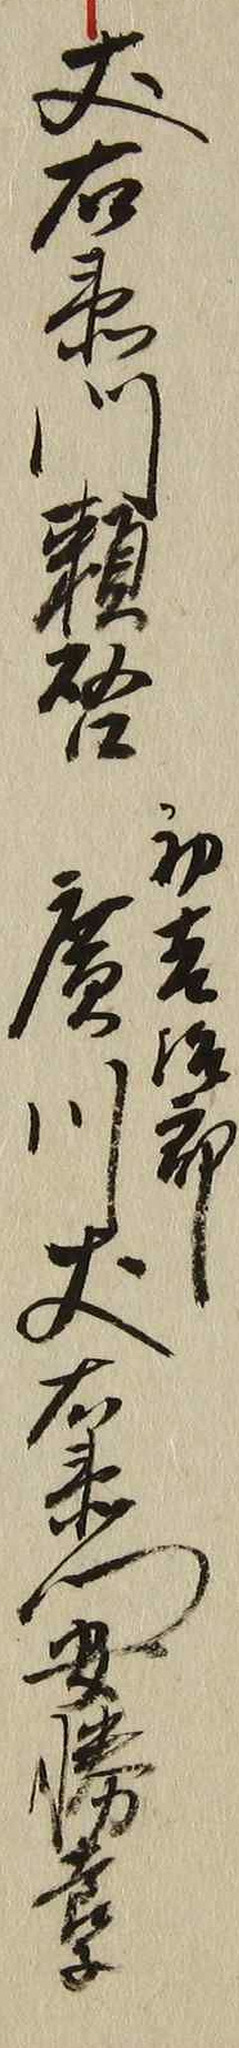丈右衛門頼啓広川丈右衛門安勝養子
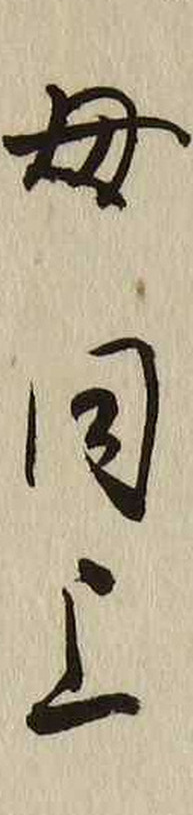母同上
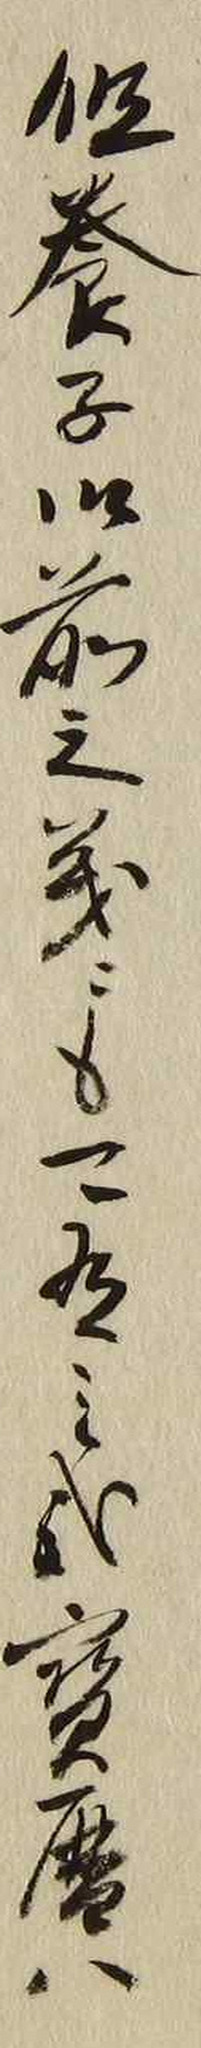但養子御前之義ニも可有之哉宝暦八
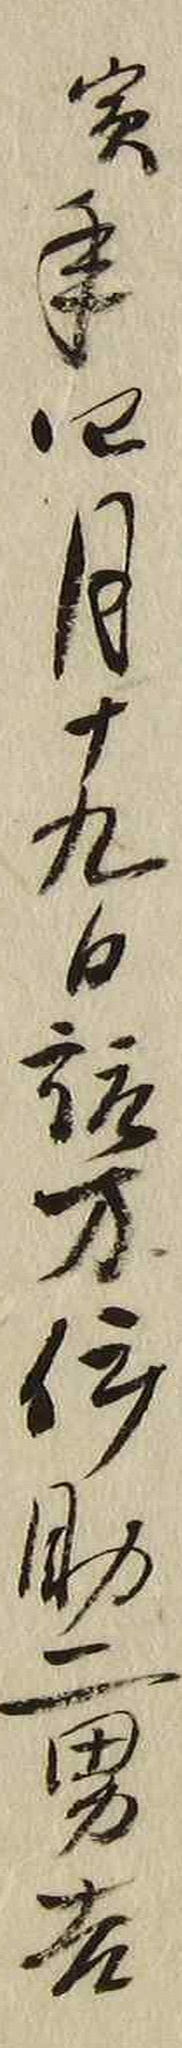寅年四月十九日諏方伊助二男吉
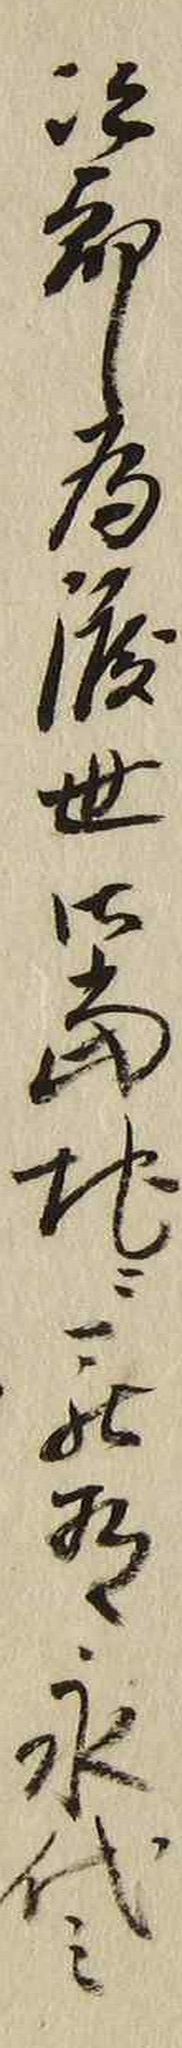次郎為渡世御当地ニ罷有永代之
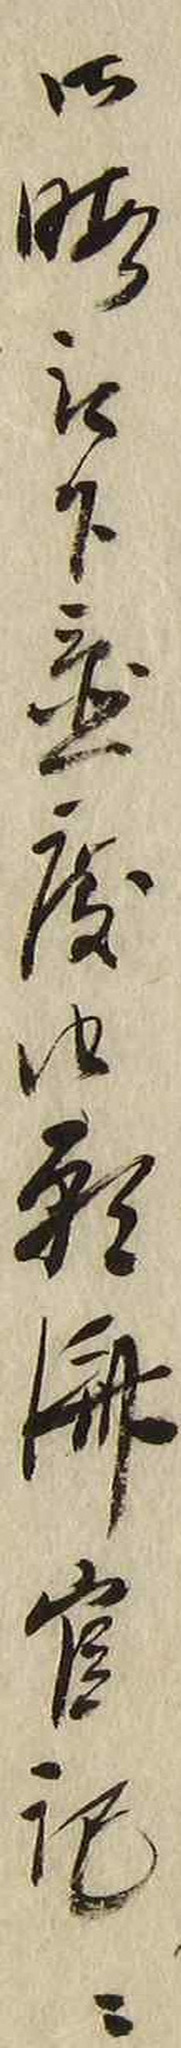御暇被下置度由願済官記ニ

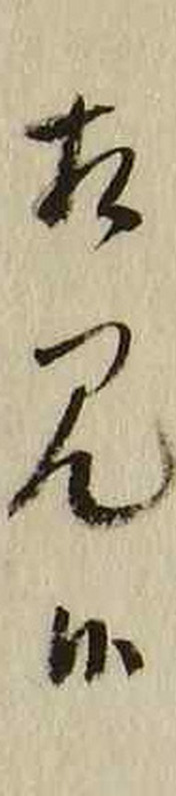相見候
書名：諸士系譜　巻之351　す之部1
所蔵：会津若松市立会津図書館
